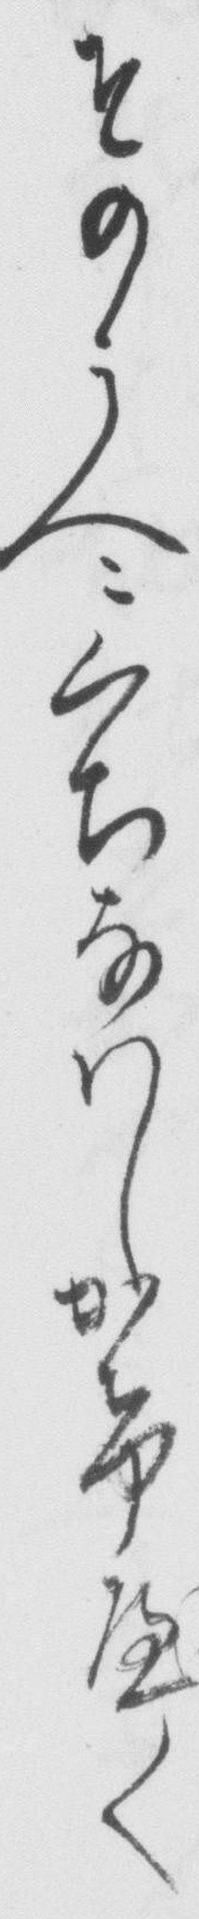そのうへニくちハなしかけやく
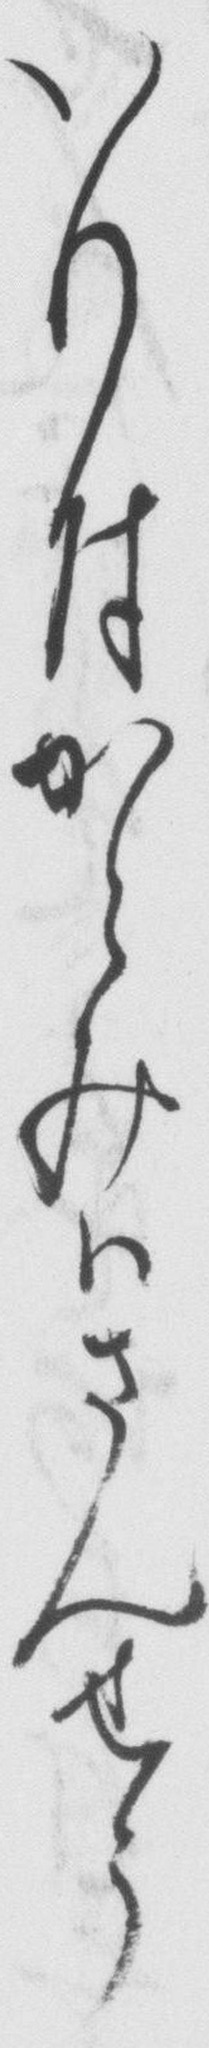いり付からみハさんせう
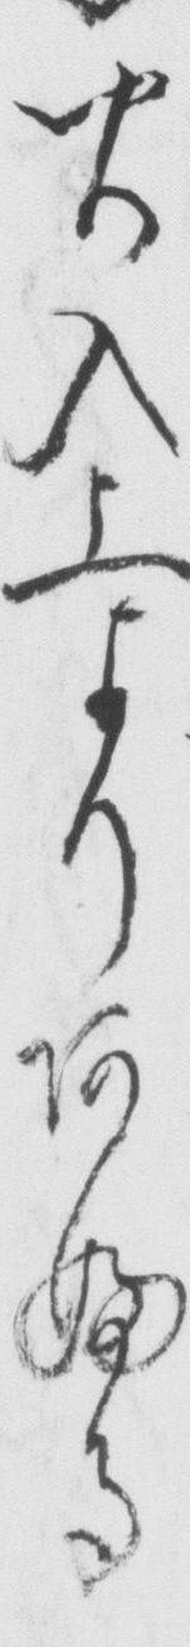火入上よりあふる
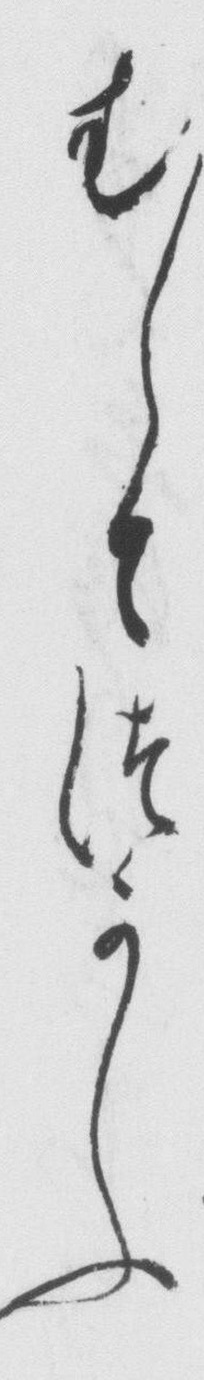むしてつかふ
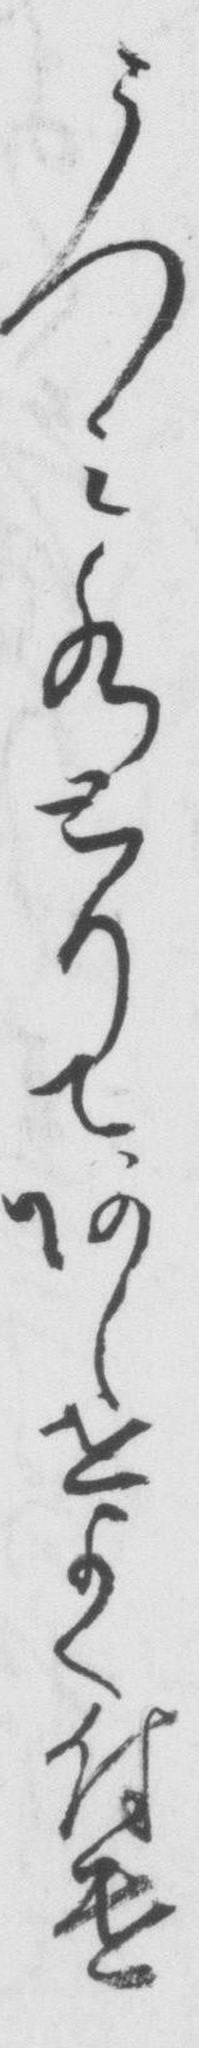うつ水とりてあをよく付遣

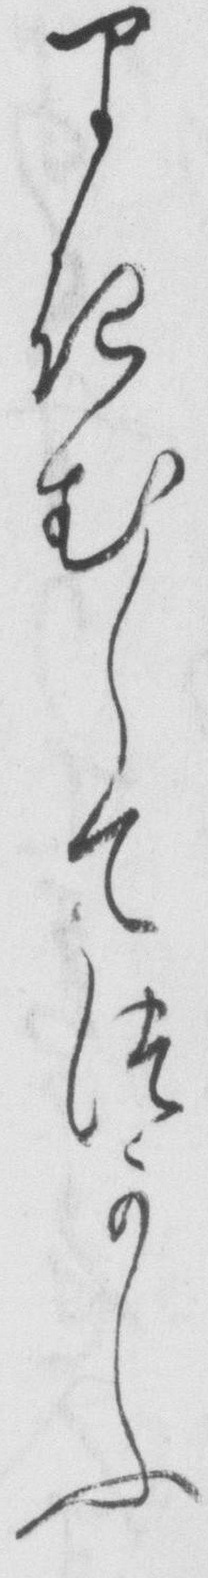まきむしてつかふ
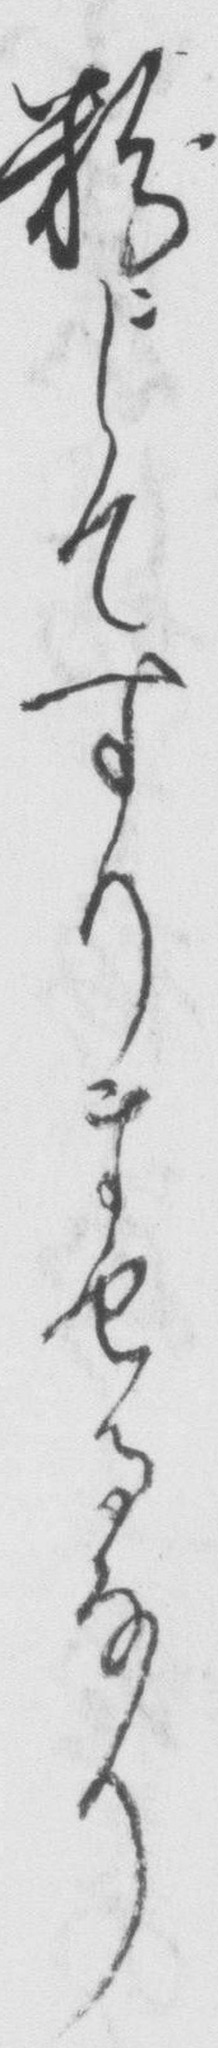粉ニにてすりませるなり
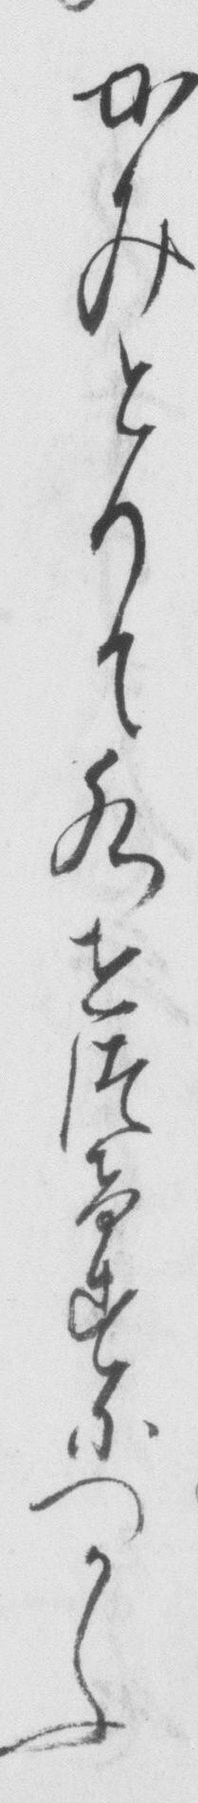かみとりて水をつけにつかふ
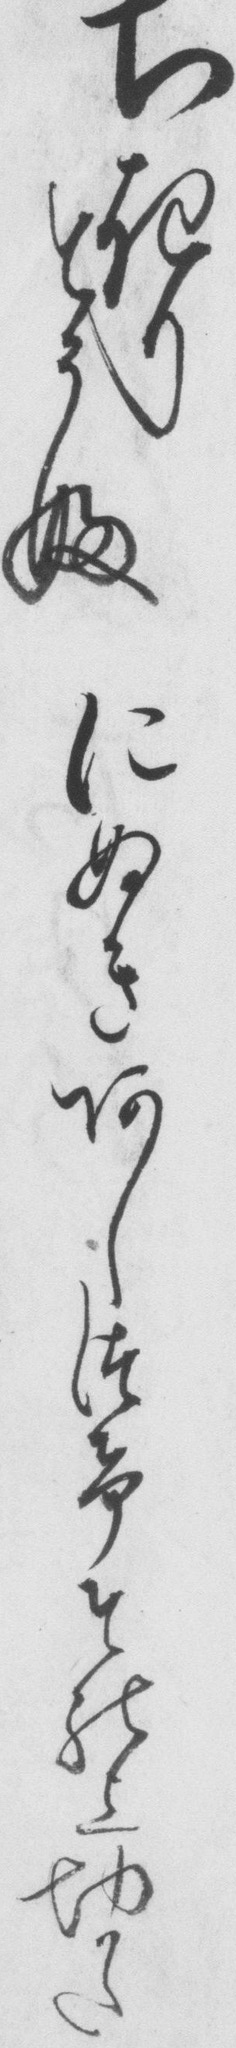一ちり煮ぬきあしつけその上切から

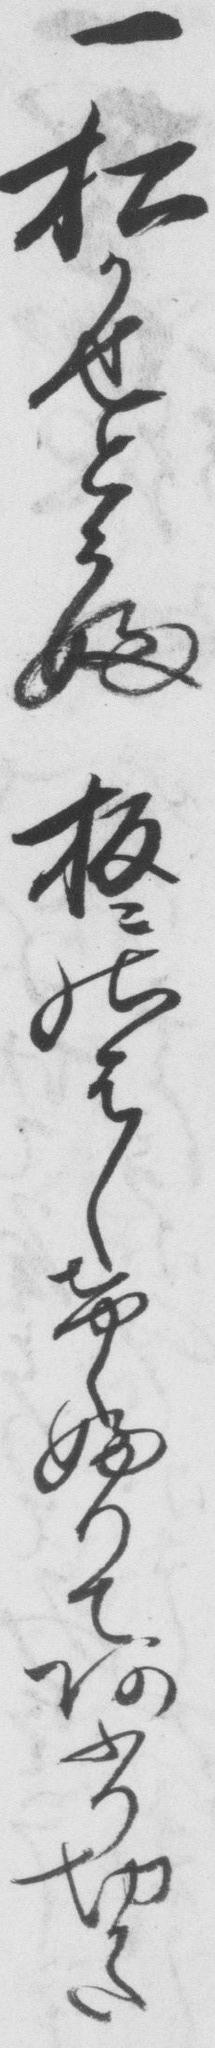一松かせとうふ板にのはしけしふりてあふり切かた
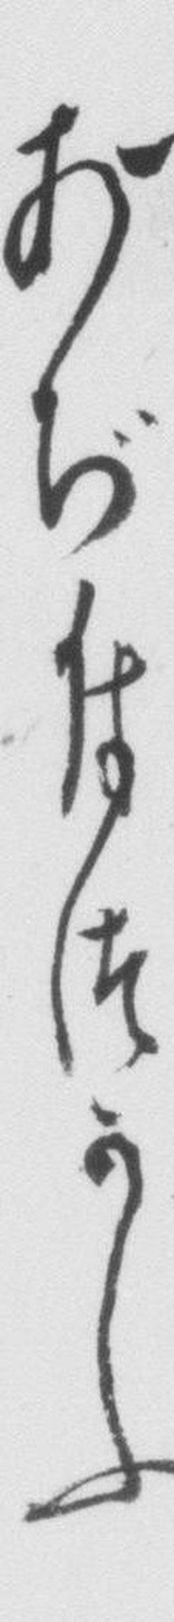あぢ付つかふ
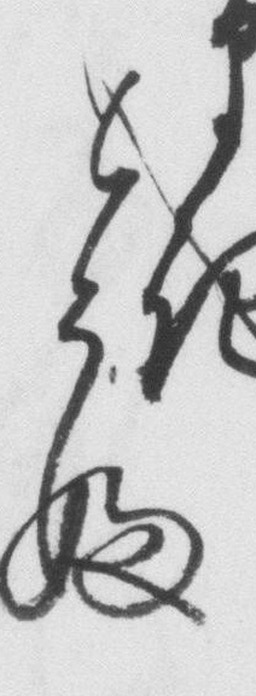とうふ
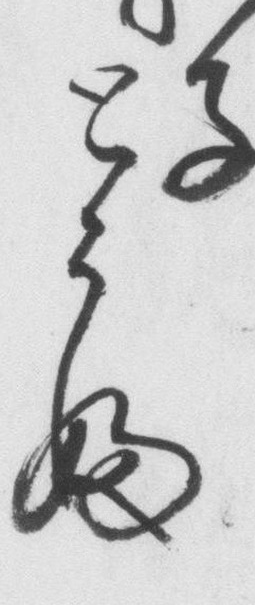とうふ
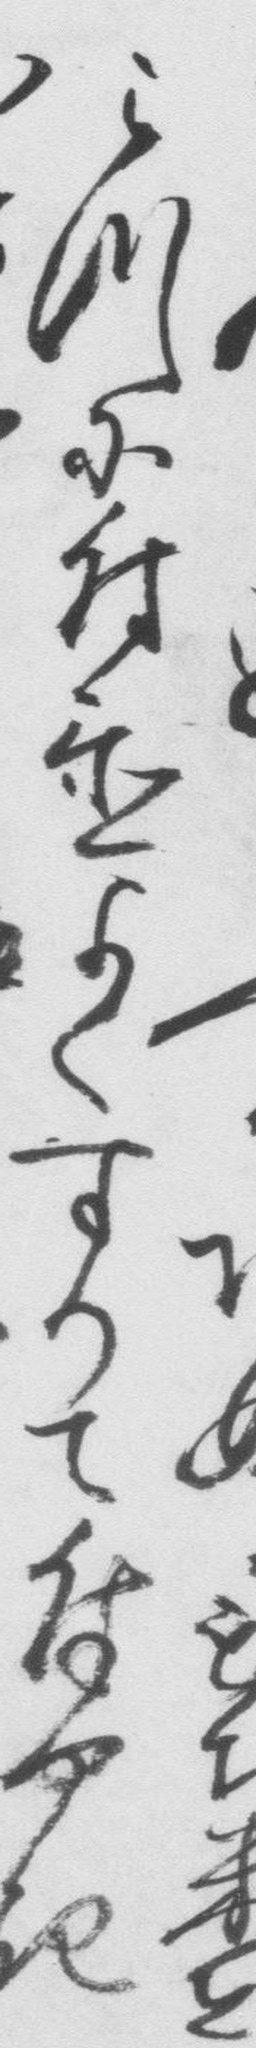ミつに付置よくすりて付やき
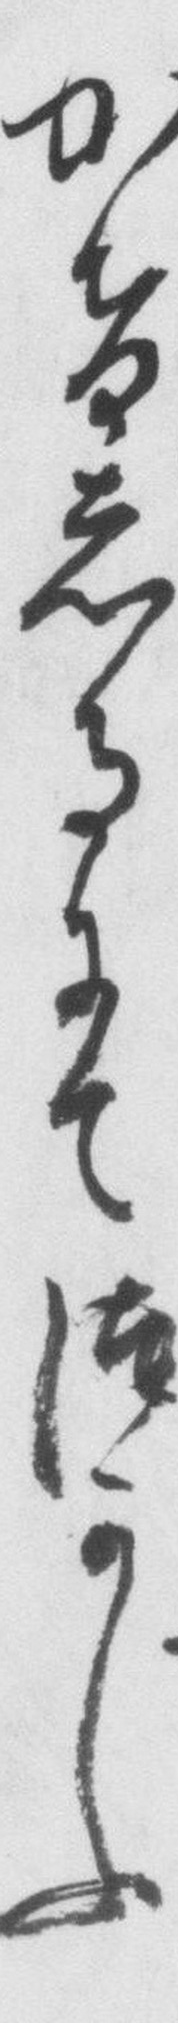かけしるにてつかふ
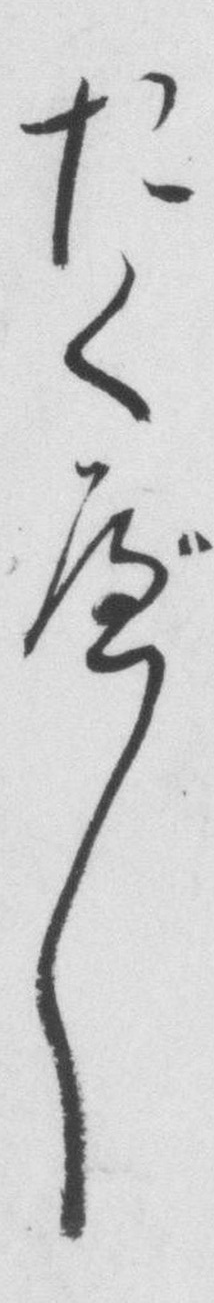たくべし
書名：料理筌
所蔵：大阪府立大学学術情報センター 国文学研究資料館
